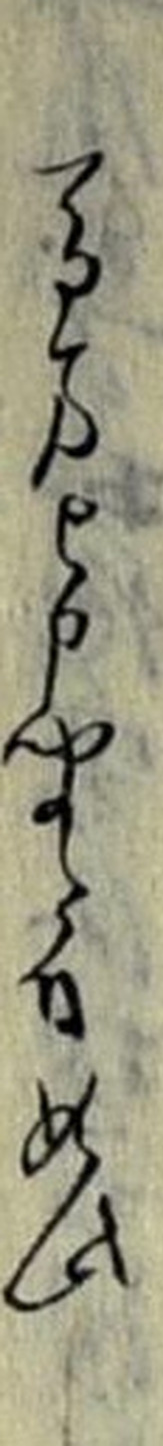馬方被申聞候ニ付如此
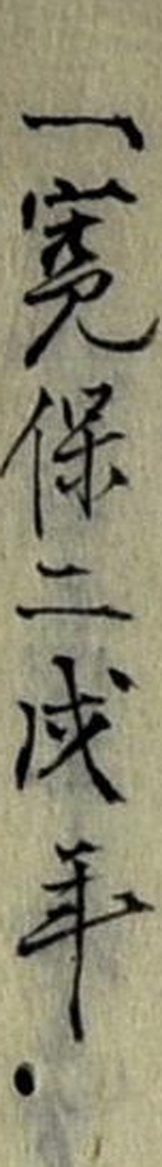一寛保二戌年
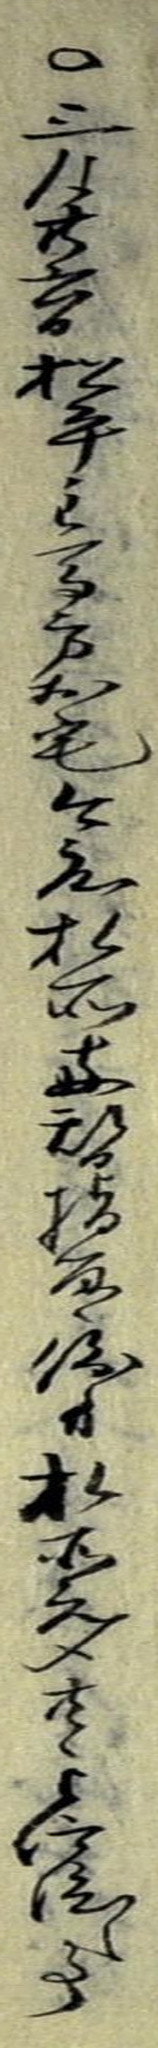〇三月廿六日松平主馬方於宅今度札所両替指留候儀ニ付札所元〆共へ被仰渡候事

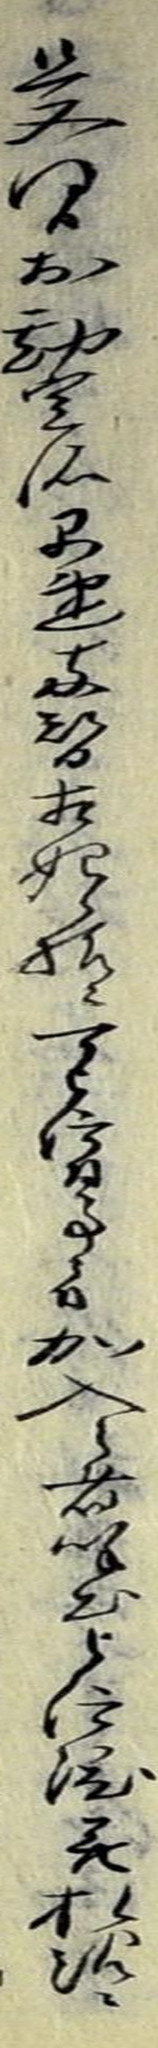且又同日於勘定所早速両替相始候様ニ可被仰付事ニ付加入之者呼出被仰渡并札銀ニ
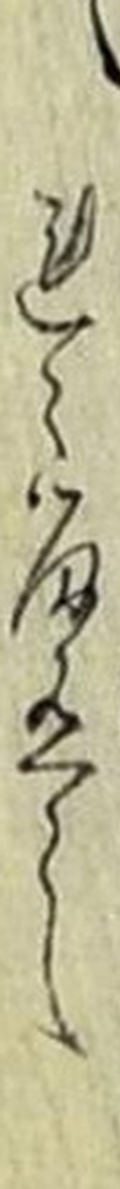連々留有之
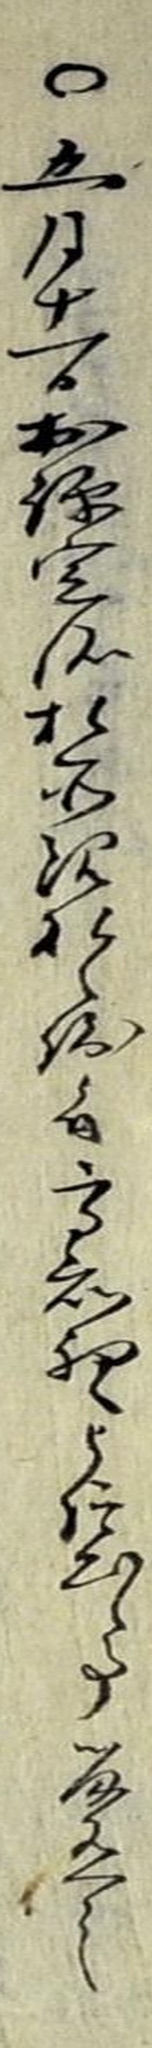〇五月十一日於評定所札所銀札之儀ニ付高知初へ被仰出候事留有之
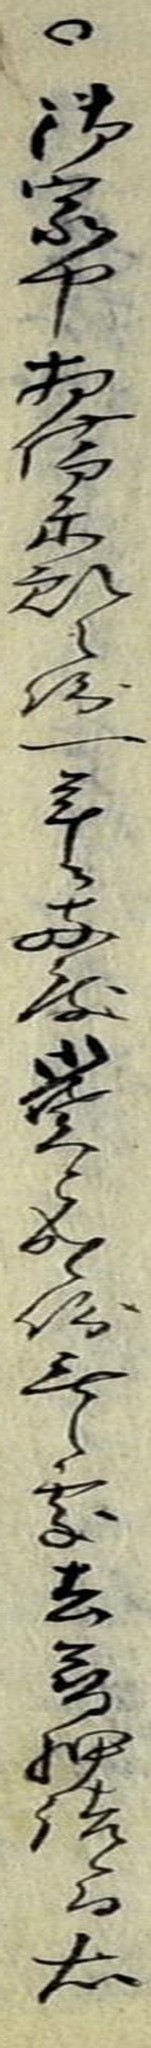〇御家中拝借米願之儀一年ニ両度御貸被成候儀無之処去暮押詰候而右
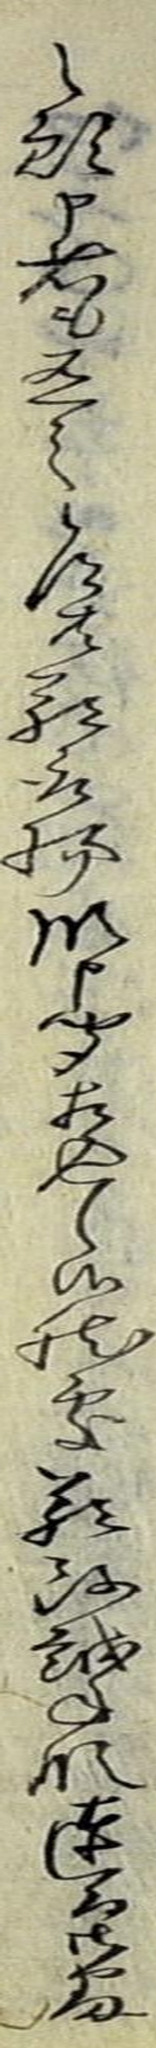之願申者も有之候得共難取揚段申聞相返し候然処難致越年段達而御番
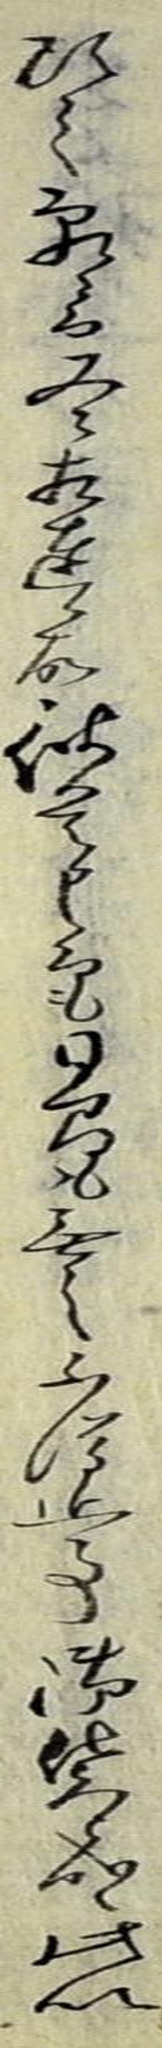頭之願ニ而又々相達候故彼是申候而も日間も無之不得止事御貸被成候此以
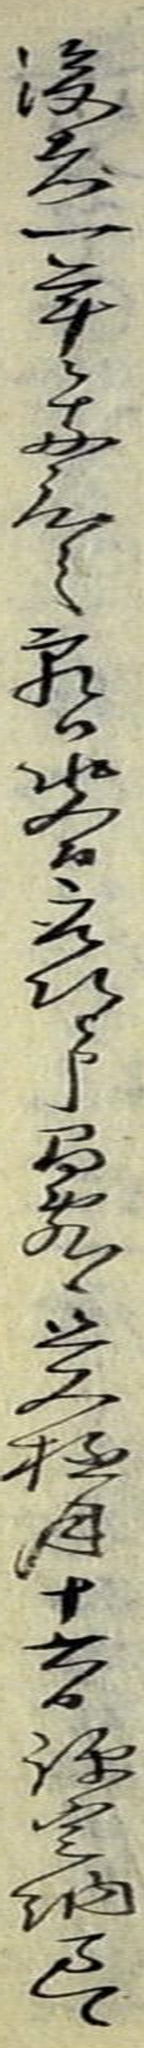後者一年ニ両度之願ハ決而取次被申間敷候且又極月十六日評定納過候
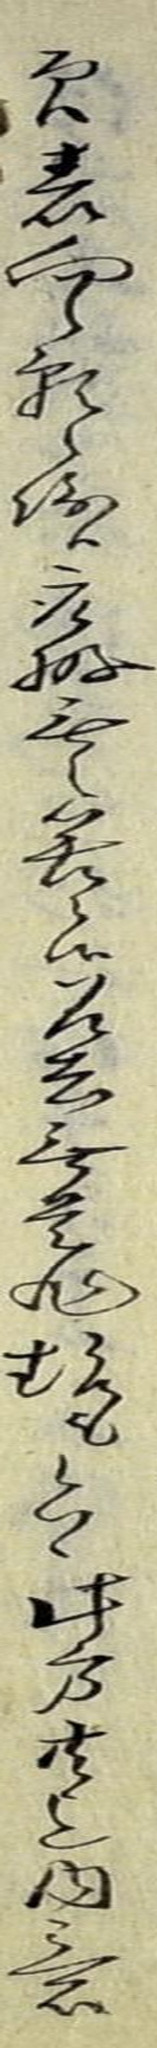而ハ表向之願之儀ハ取扱無之筈ニ候乍去無是非趣も候ハヽ此方共迄内意
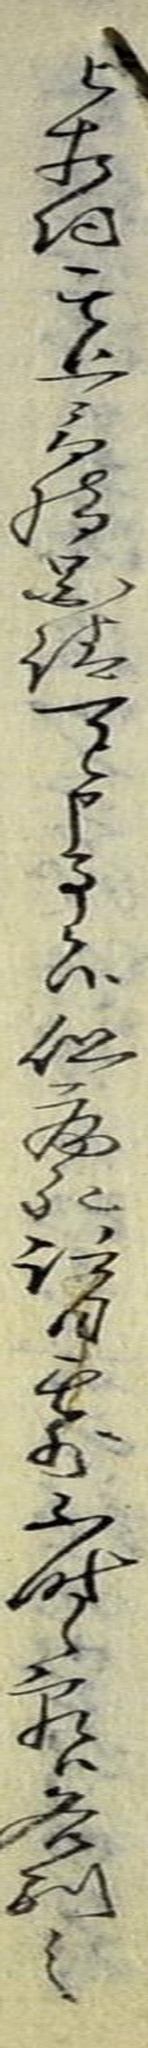被相伺其上ニ而指図請可被申事ニ候但病死跡目其外不時之願ハ各別之
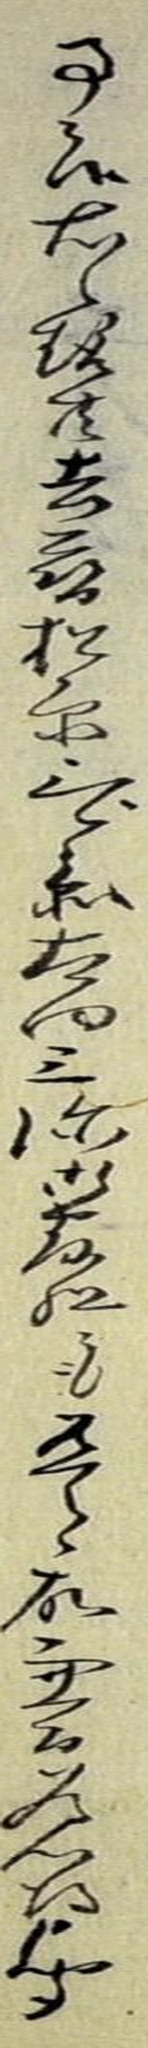事ニ候右之趣共去暮松原三郎兵衛太田三弥御番組ニも有之候故兼而為心得申聞
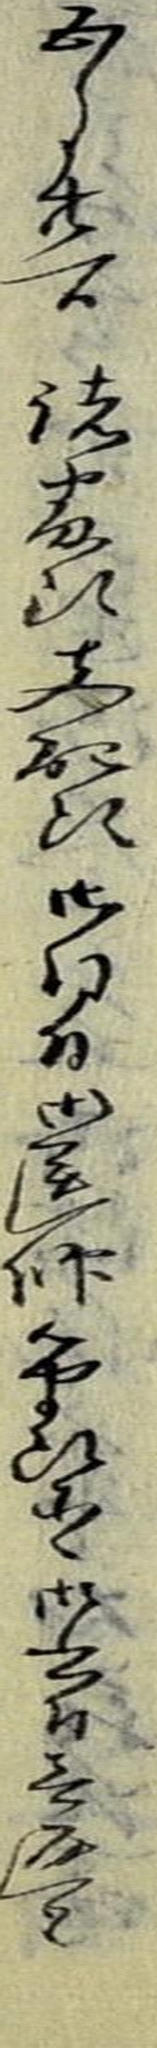五月廿一日諸番頭支配頭御目付御医師筆頭等へ御書付壱通ツヽ
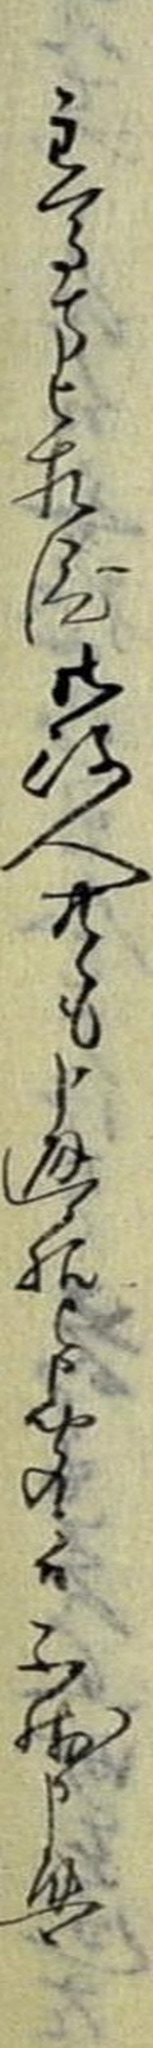主馬方被相渡御役人共へも申通候様被申聞ニ付不残申通候
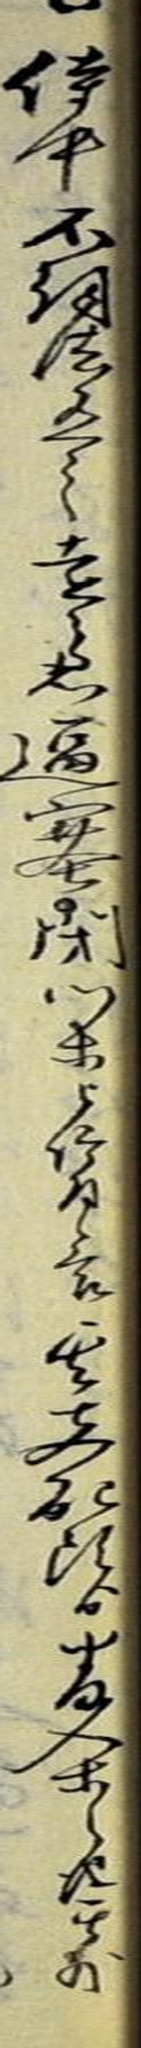〇侍中不調法有之遠慮逼塞閉門等被仰付候節其支配頭ゟ番入等之儀其外
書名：命令之部 一
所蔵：福井県文書館 Fukui Prefectural Archives
